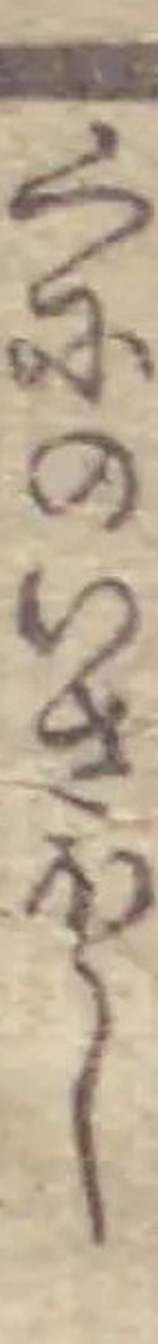くにのいさほし
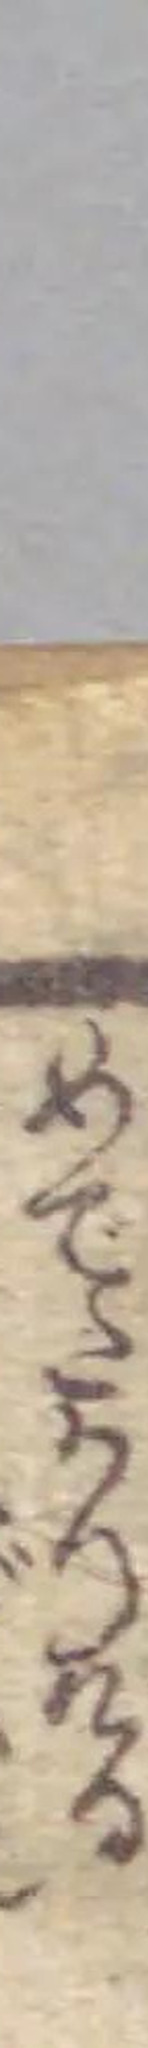めでたかりける
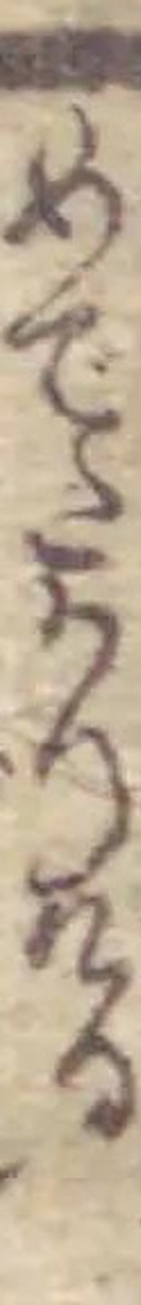めでたかりける
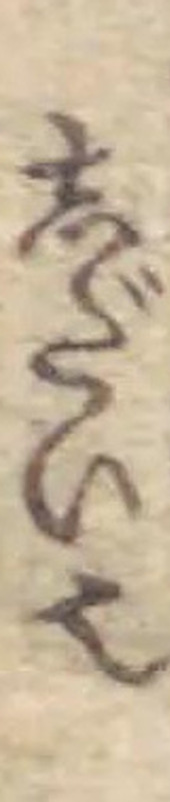しだい也

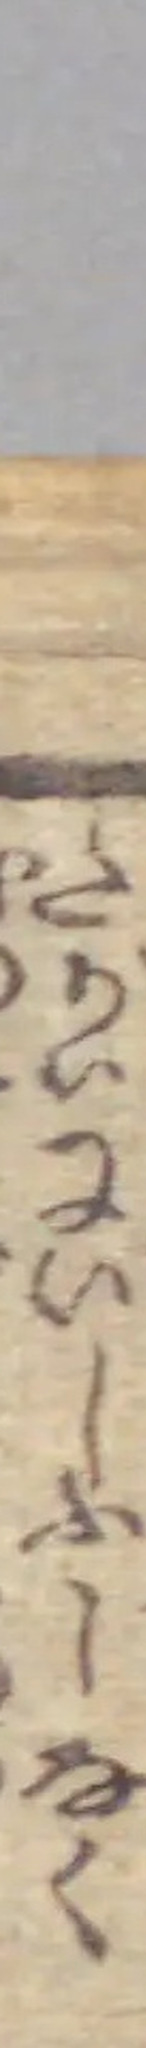たがいにいしふしなく
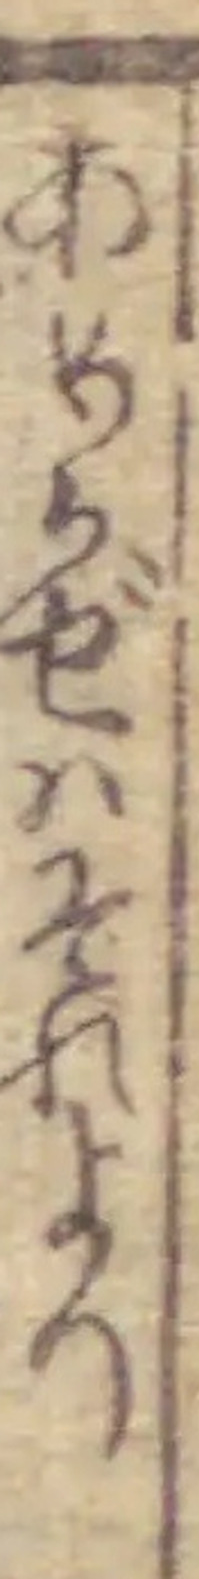あめかぜはそれより
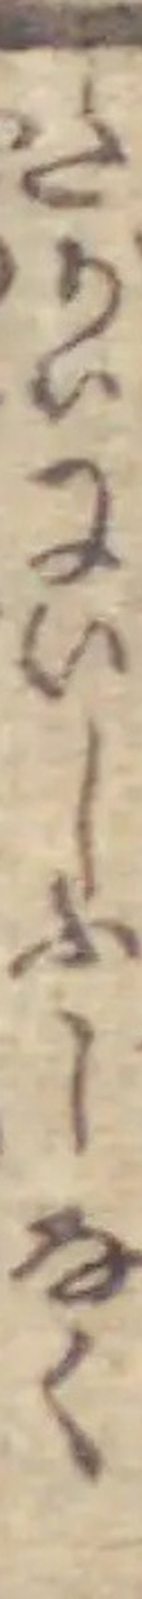たがいにいしふしなく
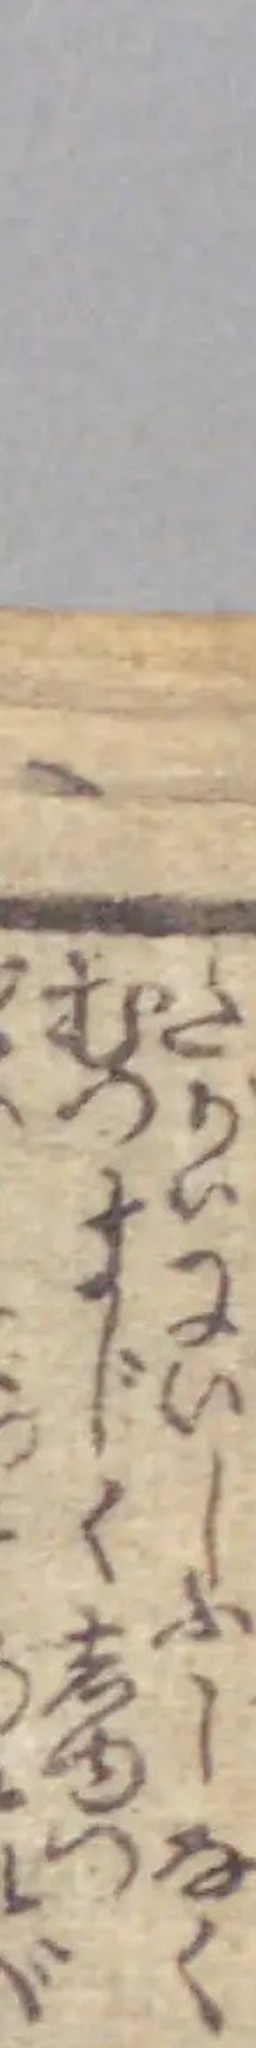むつまじくしゆつ
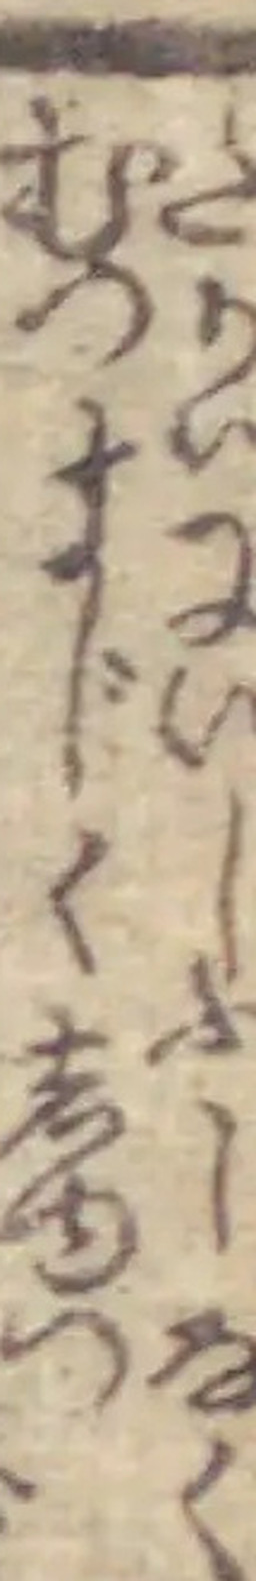むつまじくしゆつ
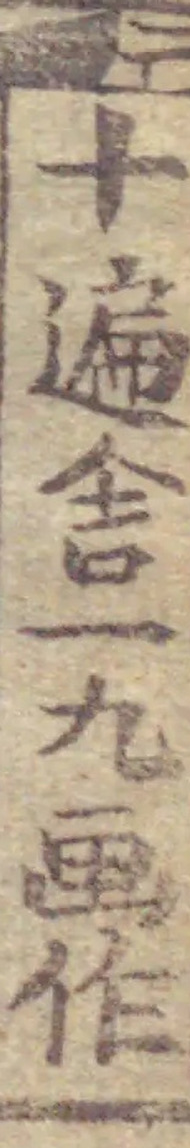十返舎一九画作
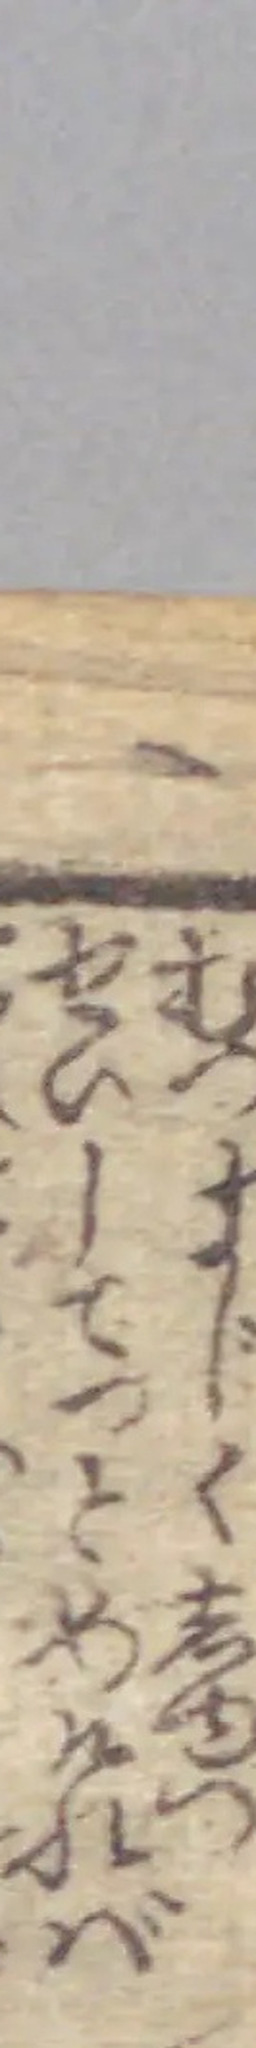せいしてつとめければ
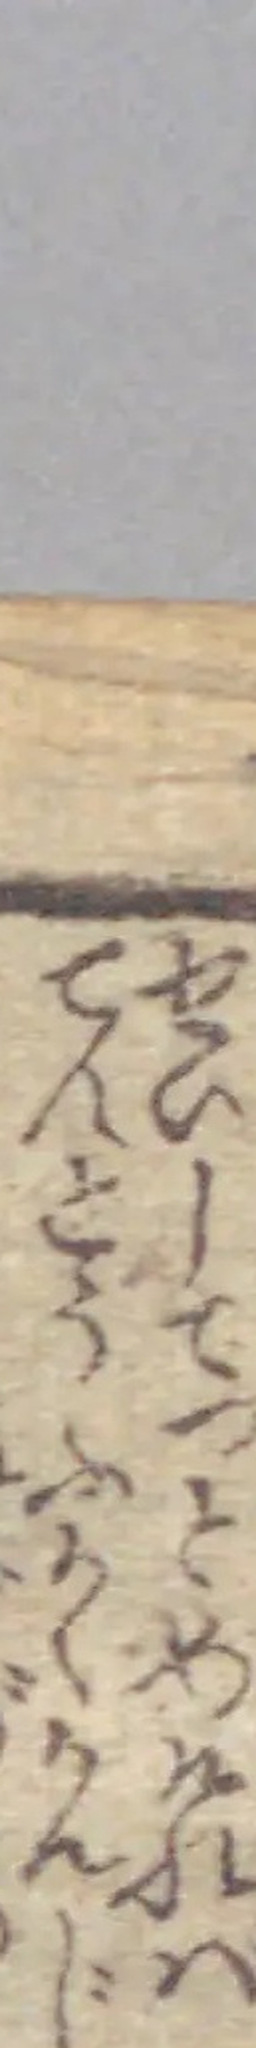てんとうふかくかんじ
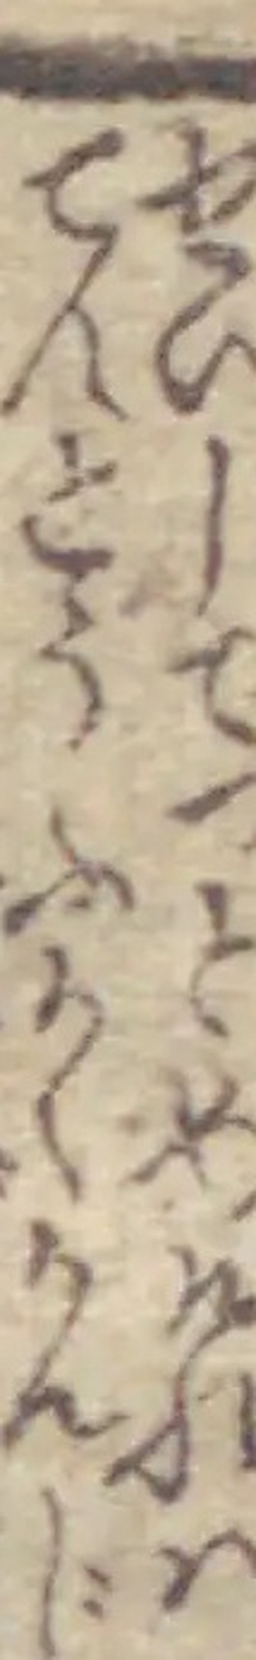てんとうふかくかんじ
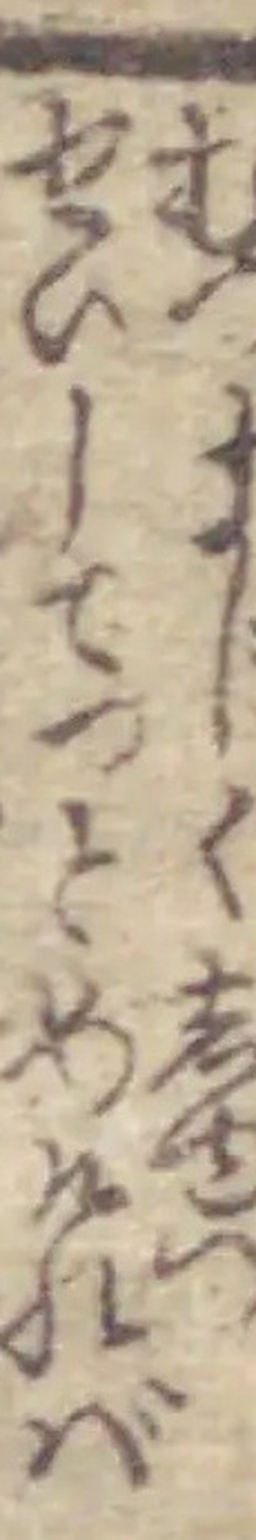せいしてつとめければ
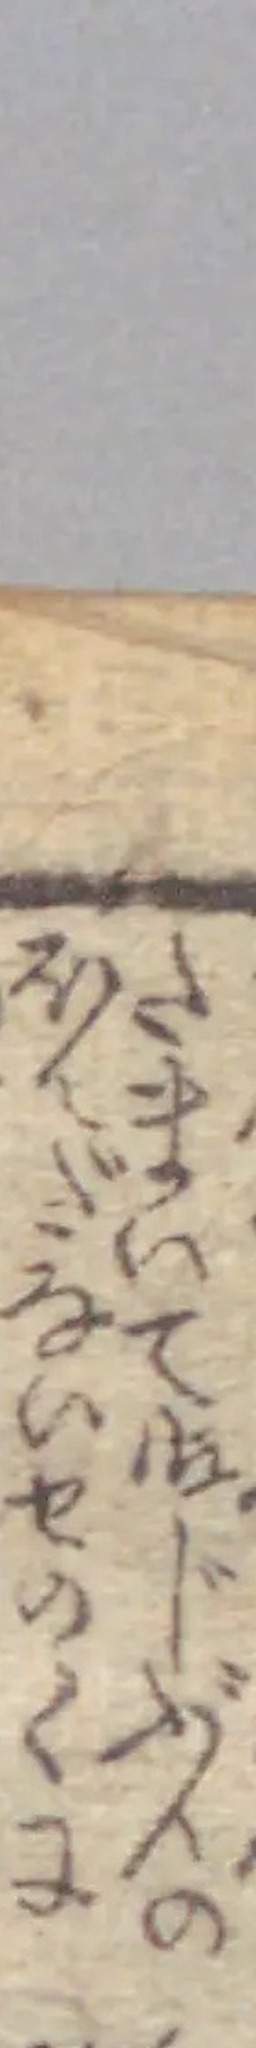ほんだないせのくに
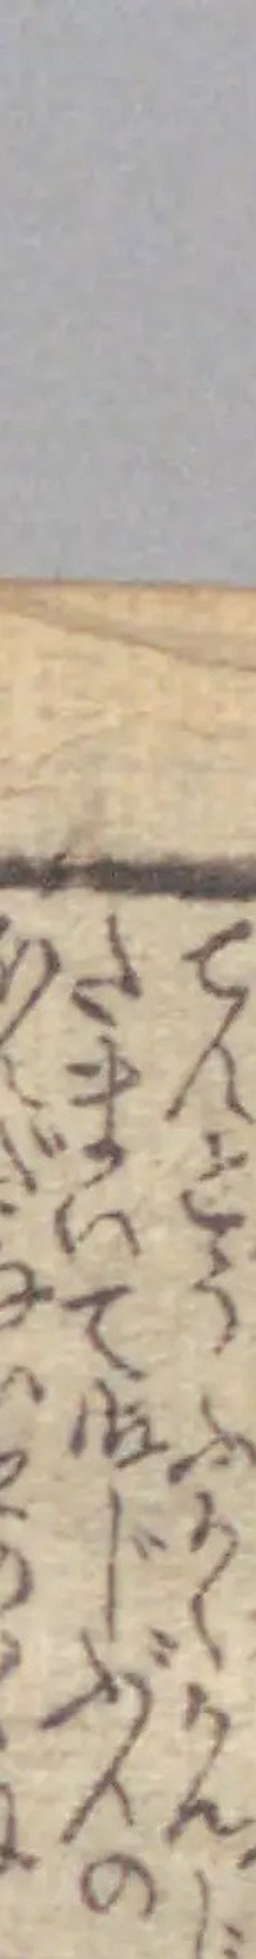たまいて御じぶんの
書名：雨宮風宮出儘略縁記 3巻
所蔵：国立国会図書館 National Diet Library, JAPAN
